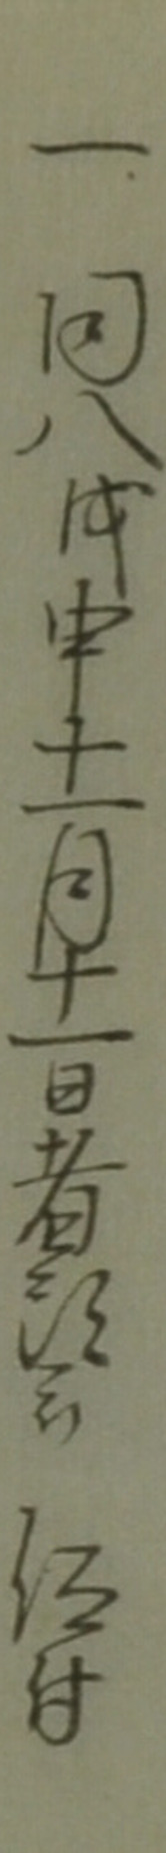一同八戊申十一月十一日者頭被仰付
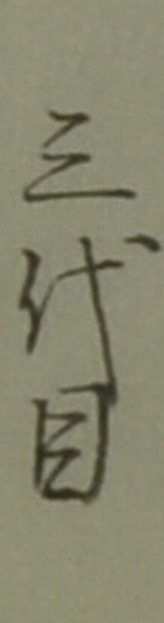三代目
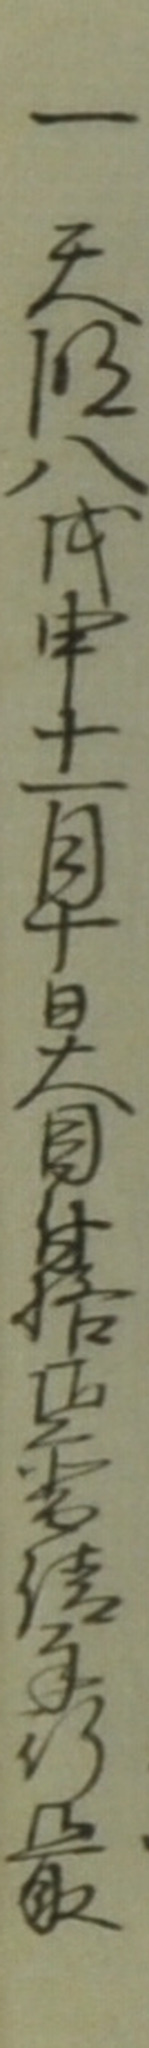一天明八戊申十一月十日大目付格御普請奉行御取
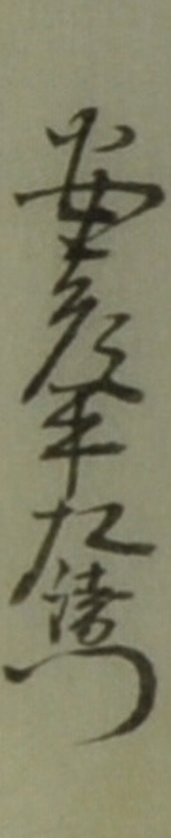安彦平左衛門

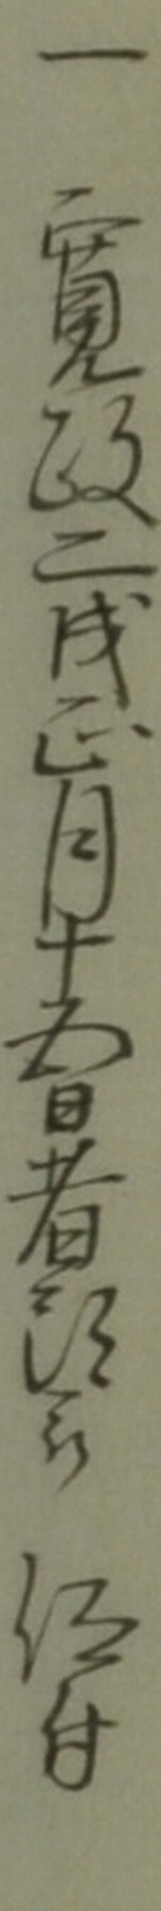一寛政二戌正月十五日者頭被仰付
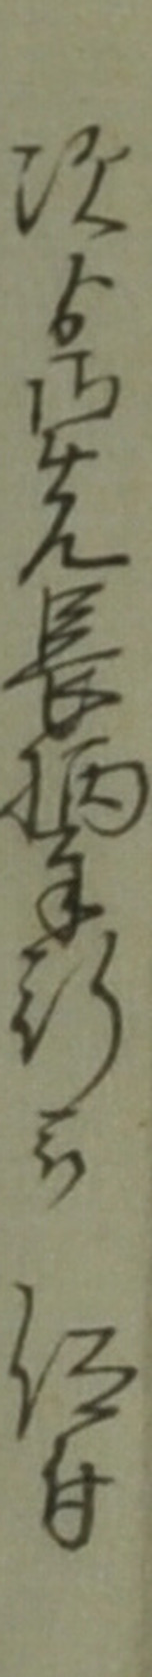次ゟ御先長柄奉行被仰付
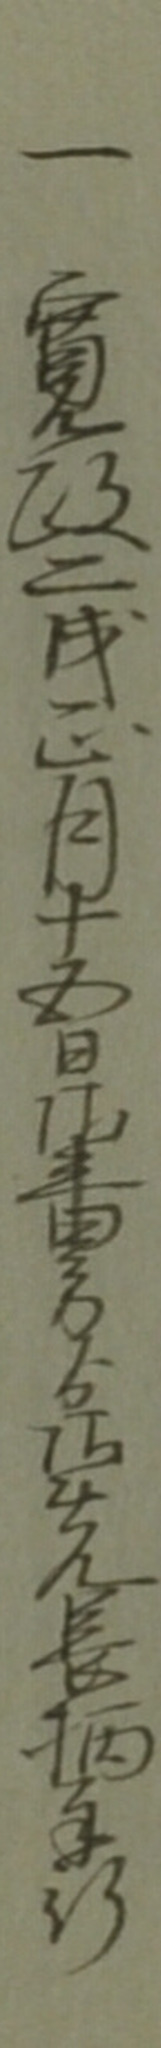一寛政二戌正月十五日御番方ゟ御先長柄奉行
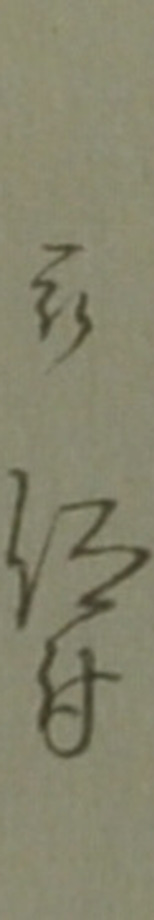被仰付
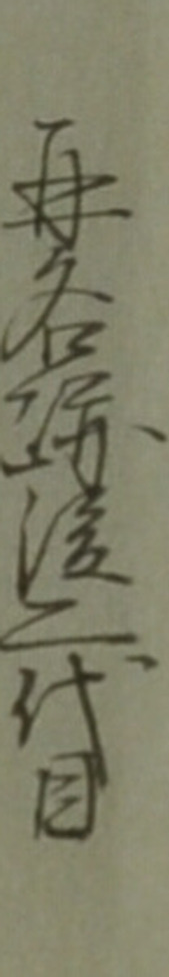再名跡後二代目
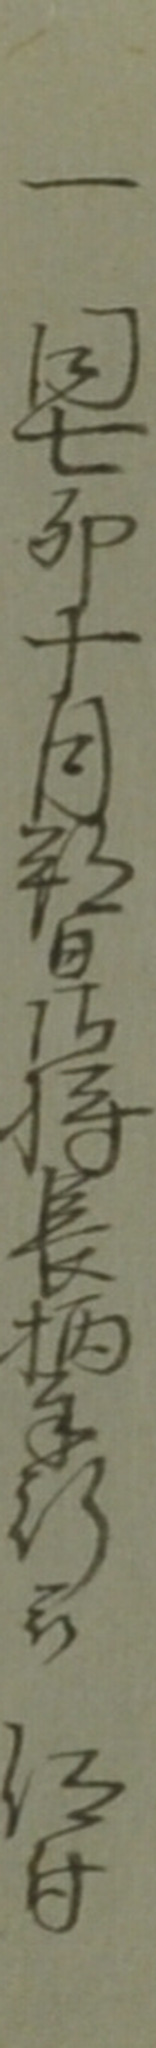一同七卯十月朔日御持長柄奉行被仰付
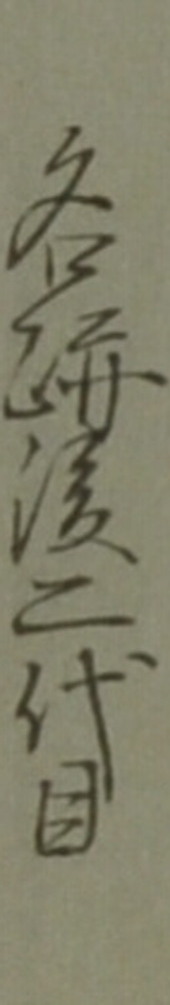再名跡後二代目
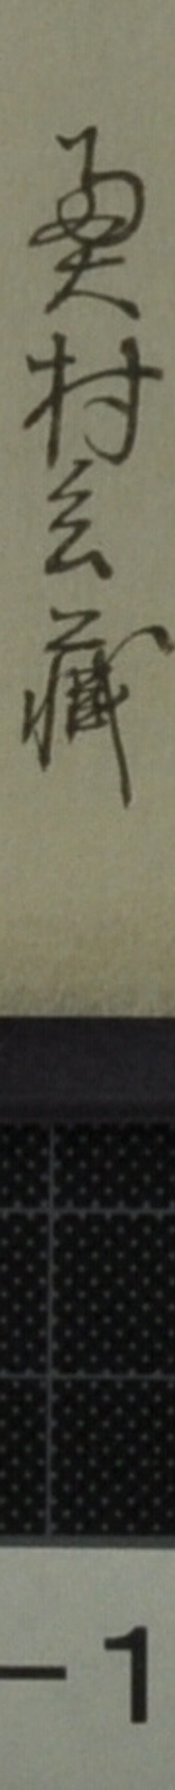奥村兵蔵
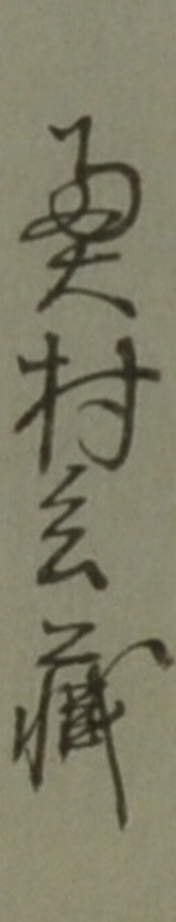奥村兵蔵
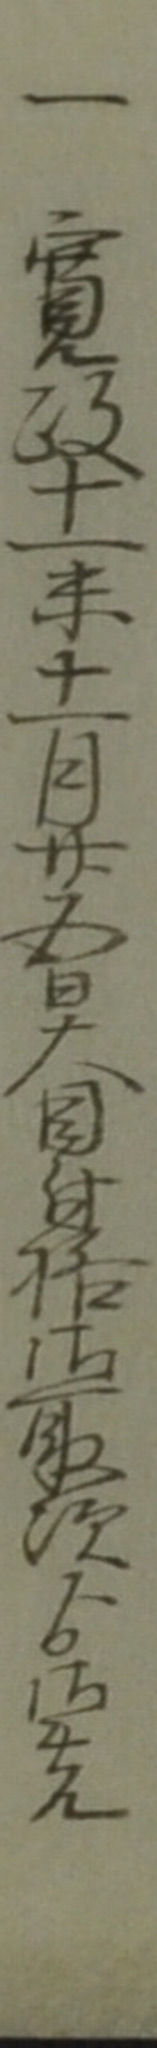一寛政十一未十一月廿五日大目付格御取次ゟ御先
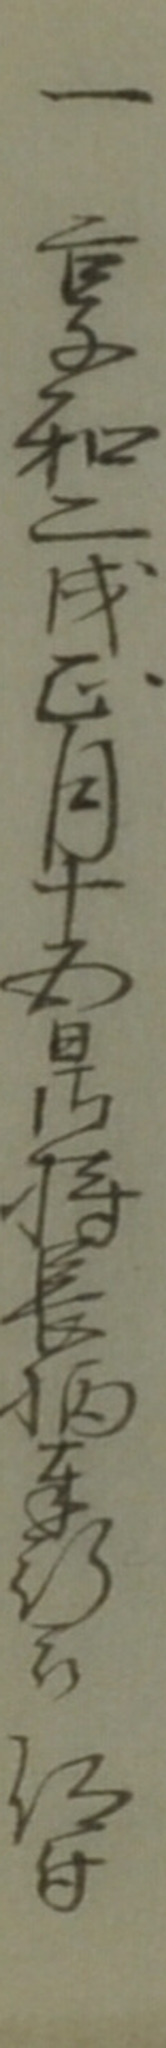一享和二戌正月十五日御持長柄奉行被仰付
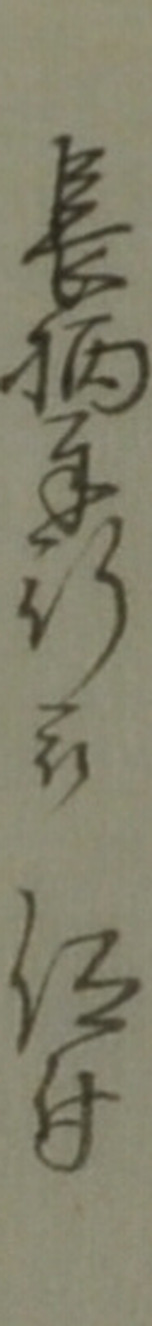長柄奉行被仰付
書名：諸御役代々録（三）
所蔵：伊那市立高遠町図書館・合同会社AMANE
